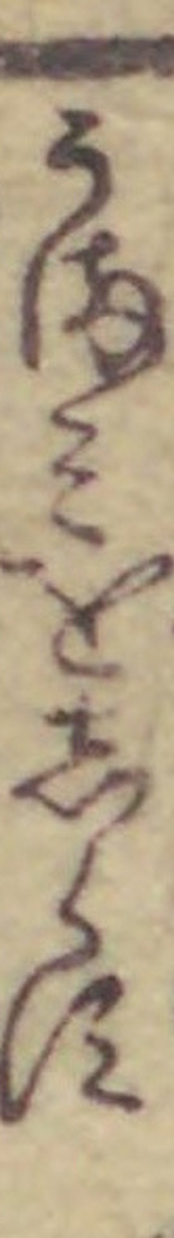うまみをしらす
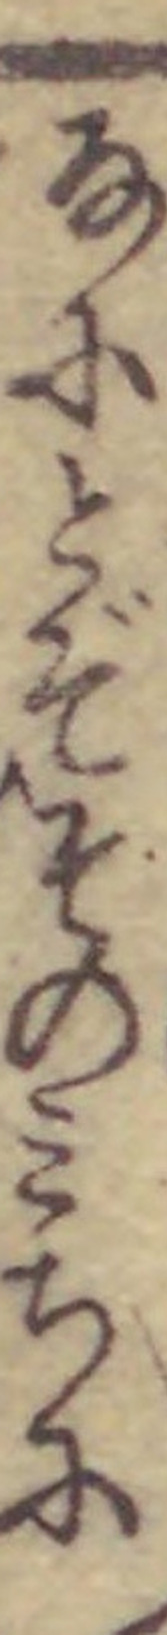なにとぞそのみちに
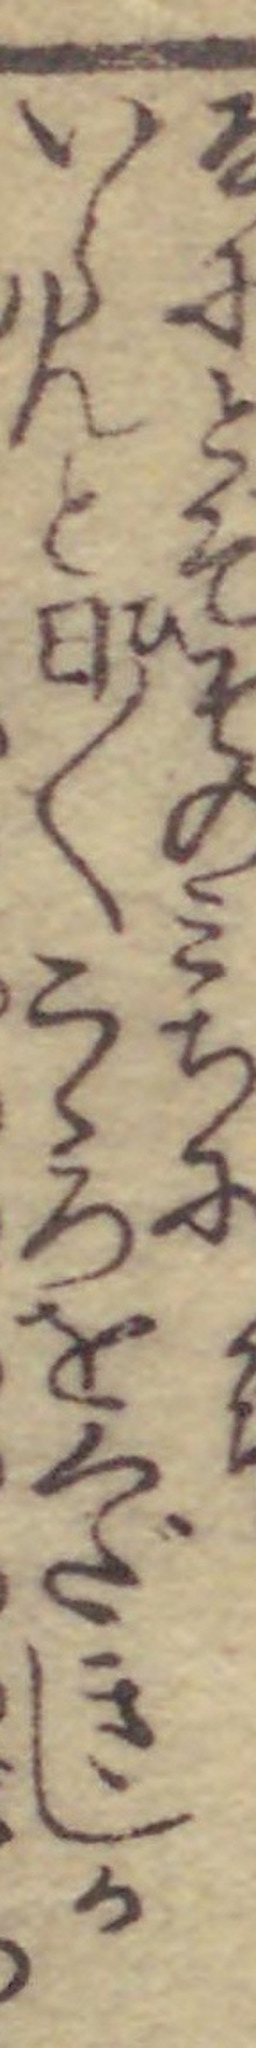いらんと日〳〵こゝろをくだきしか
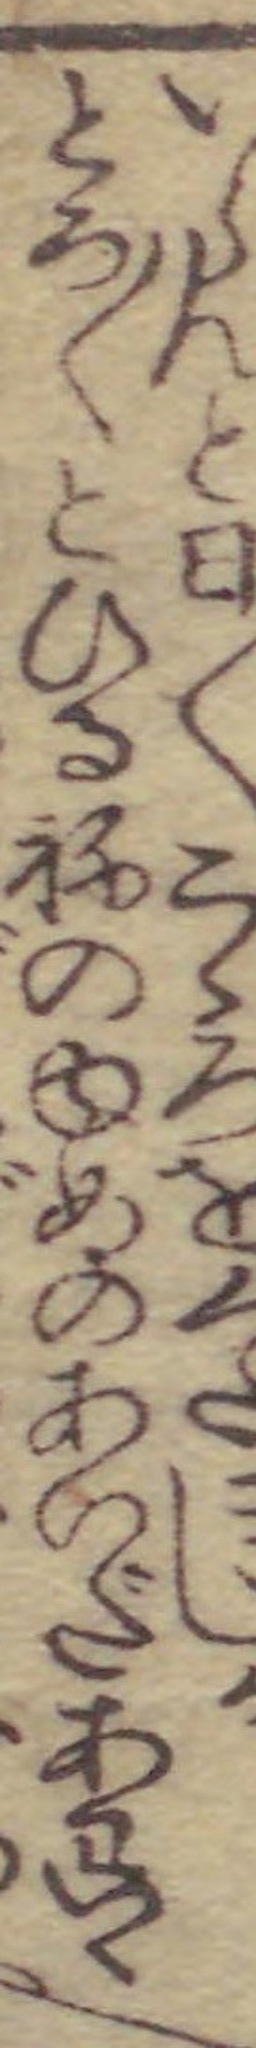とろ〳〵とひるねのゆめのあいだあわいゝ
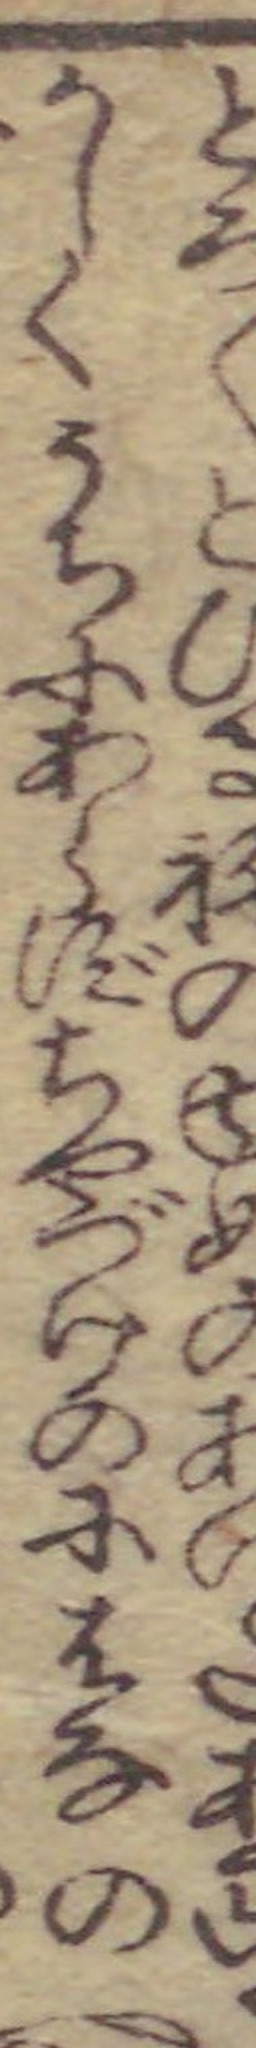かしくうちにあらずちやづけのにはなの
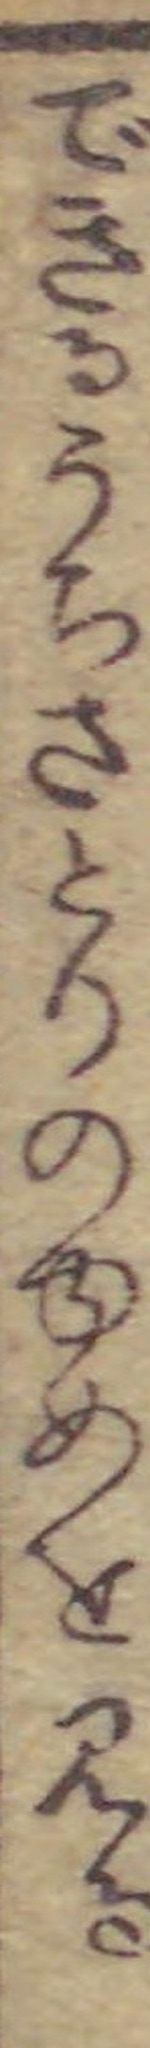できるうちさとりのゆめを見る

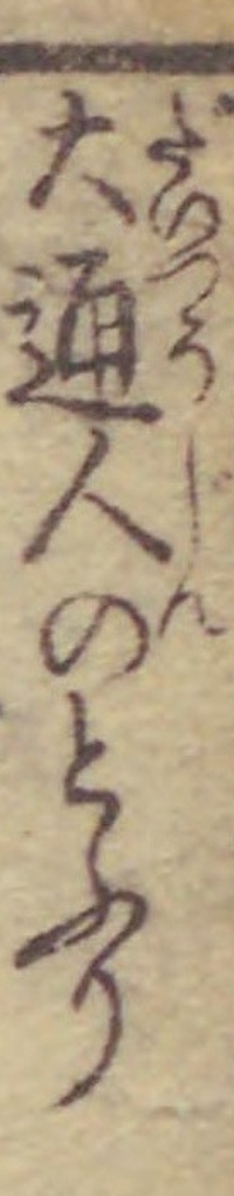大通人のとふり
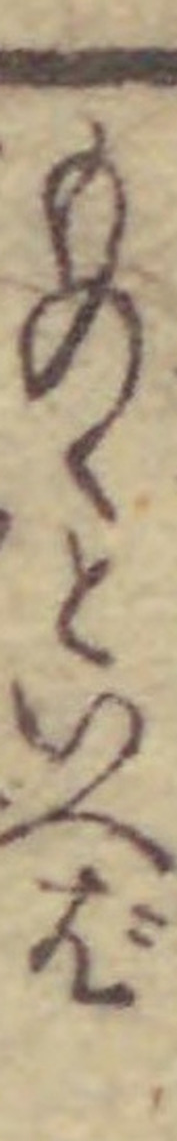ものゝといへば
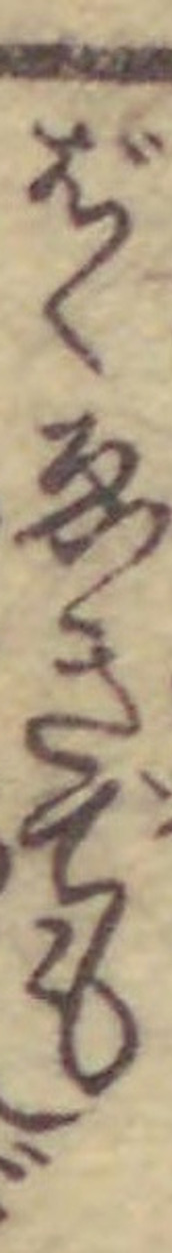ばくゑきでも
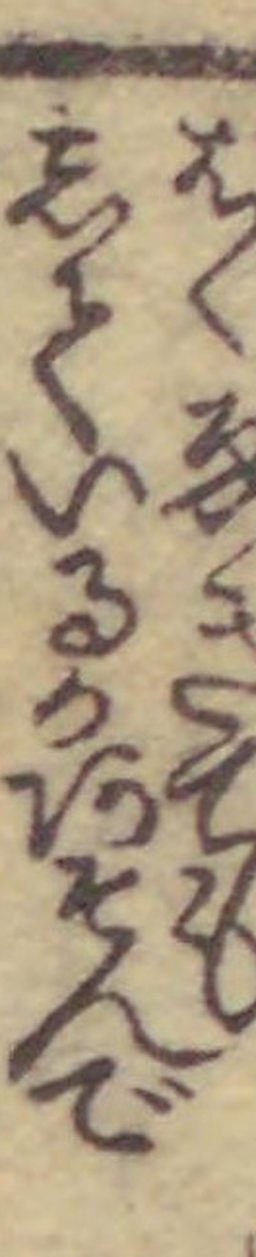しているかあそんで
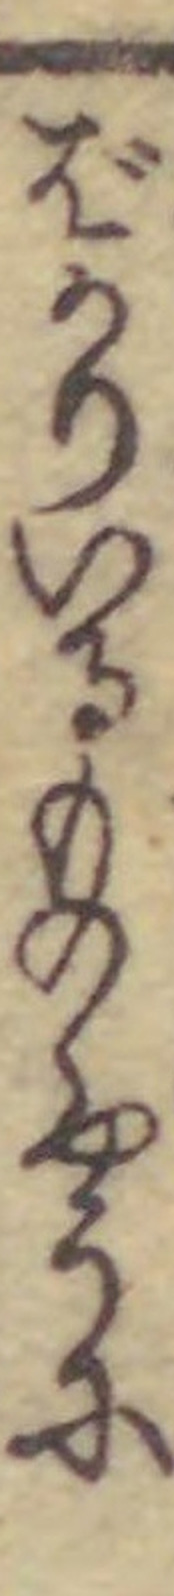ばかりいるものゝやうに
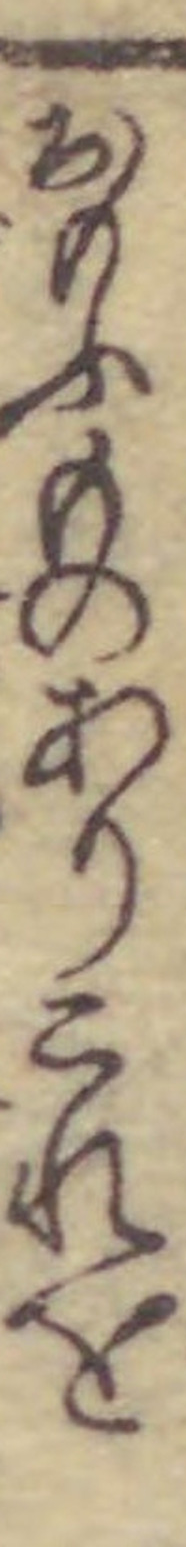おもふものありこれを
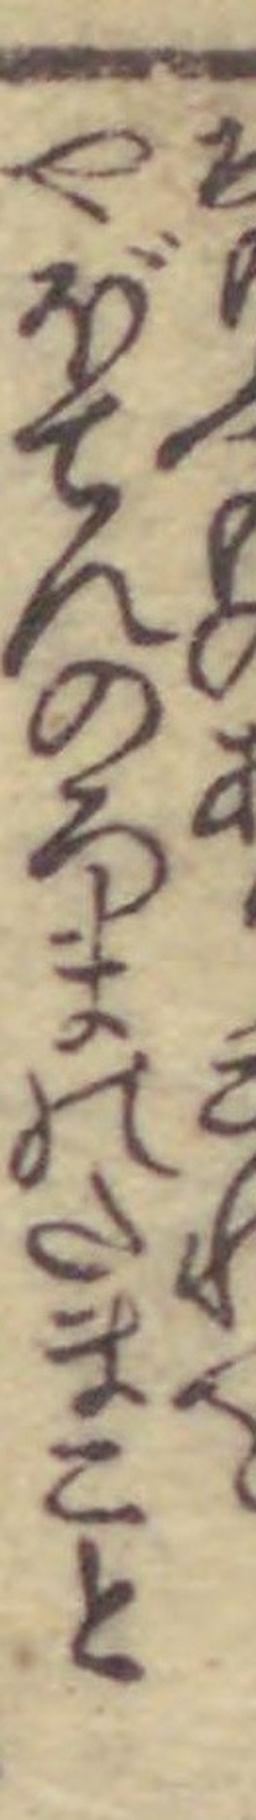やぼてんのろまのたまこと
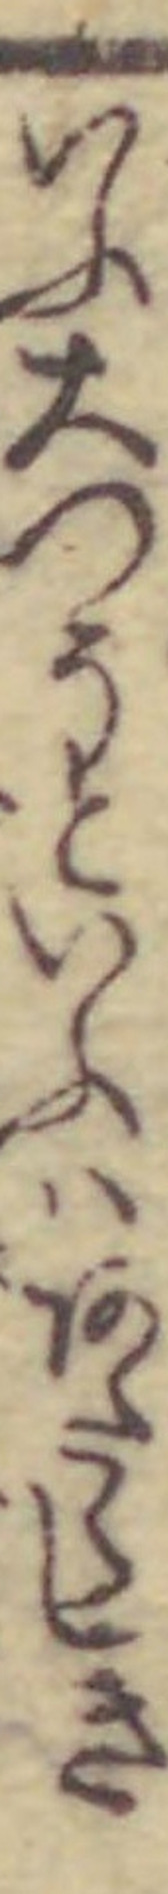いふ大つうといふはあたらしき
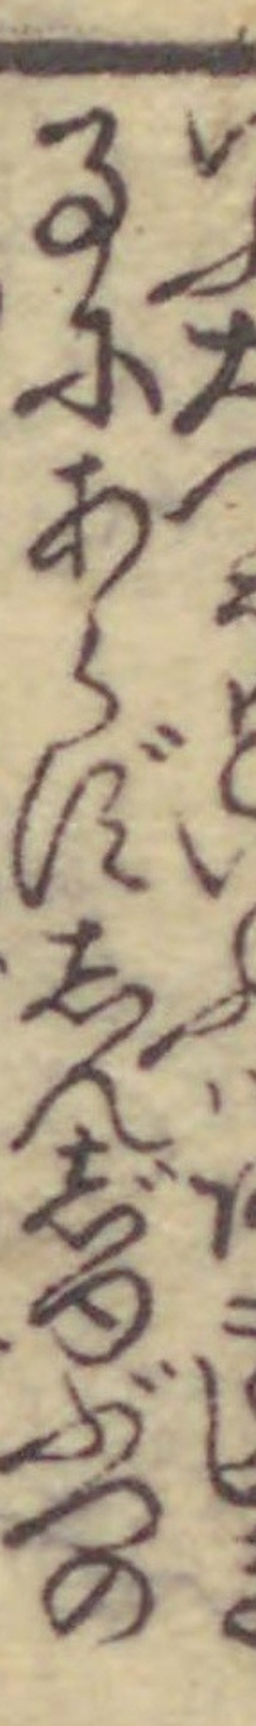事にあらずしんじゆぶつの
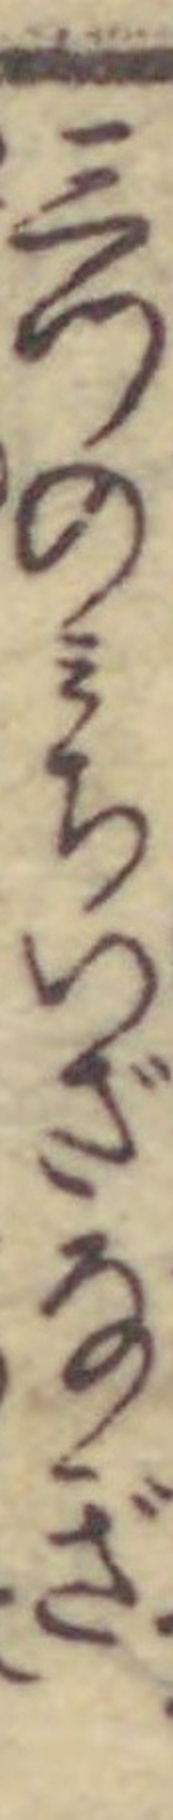三つのみちいざなぎ
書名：大通人穴[サガシ] 3巻
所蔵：国立国会図書館 National Diet Library, JAPAN
